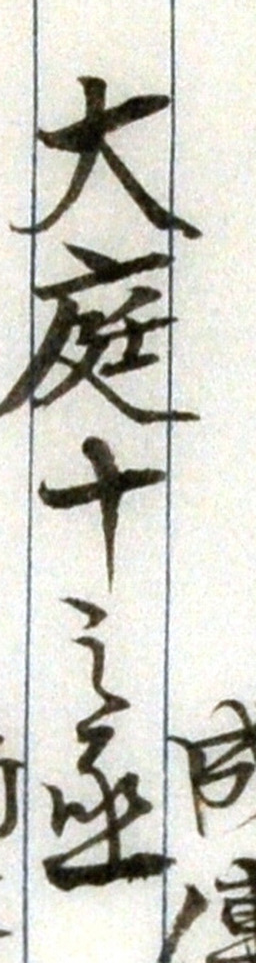大庭十之丞
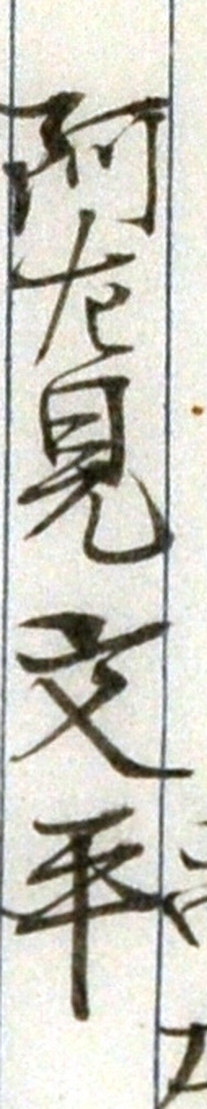阿左見文平
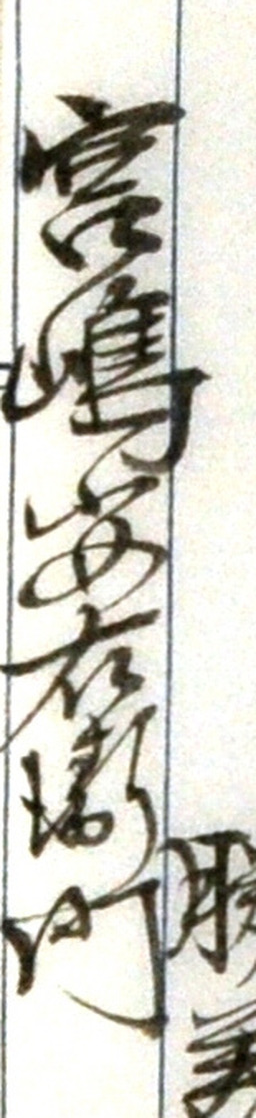宮嶋安右衛門

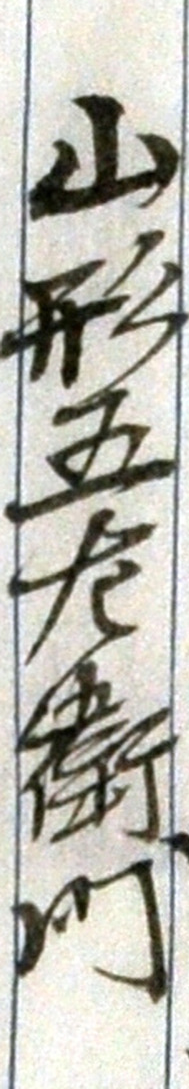山形五左衛門
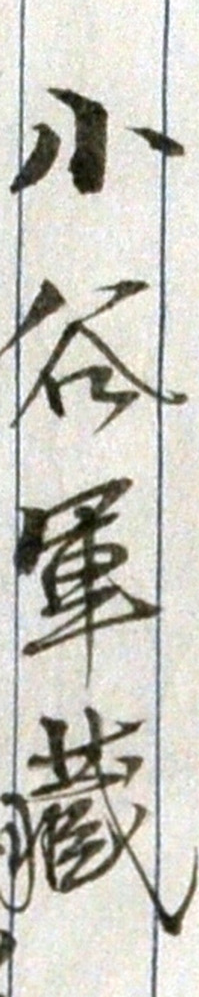小谷軍蔵
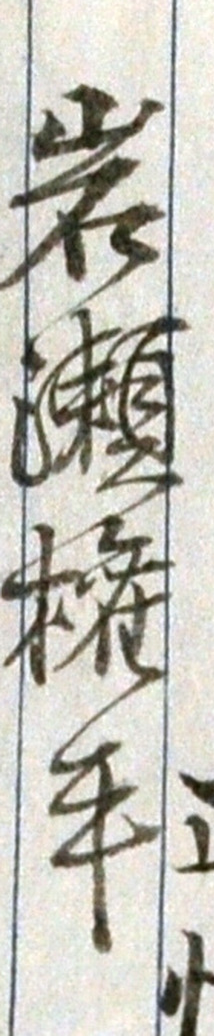岩瀬権平
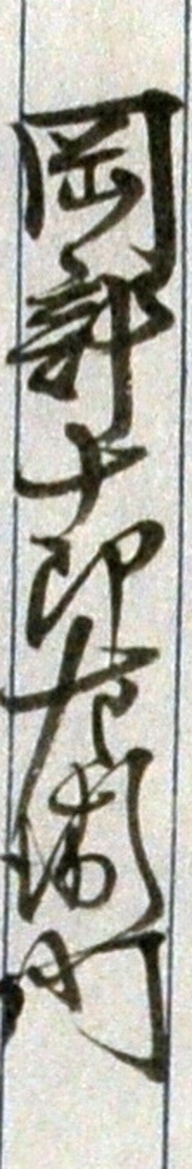岡部十郎左衛門
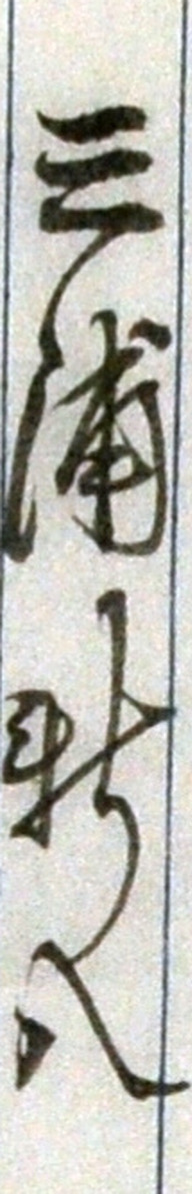三浦新八
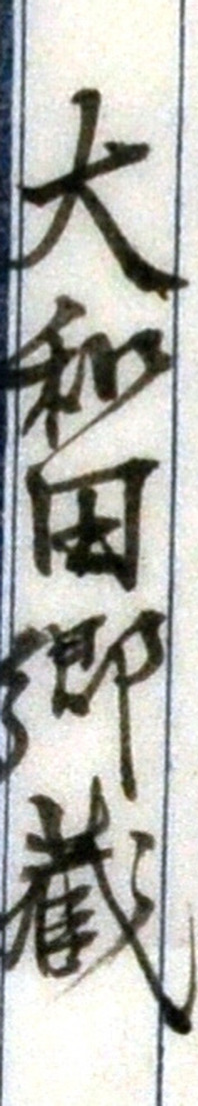大和田郷蔵
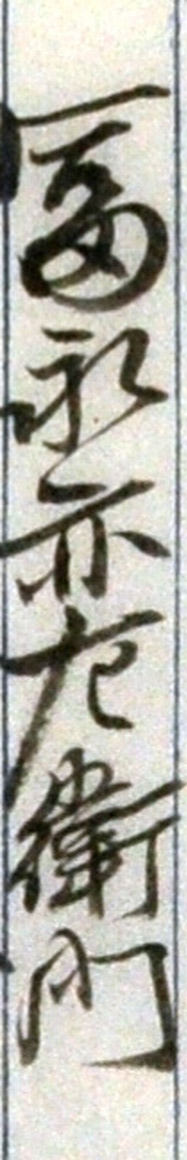富永亦左衛門
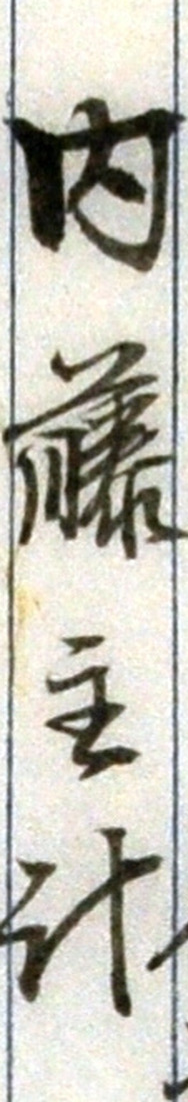内藤主計
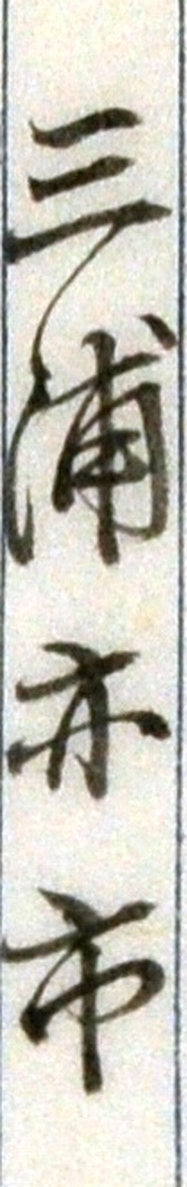三浦亦市
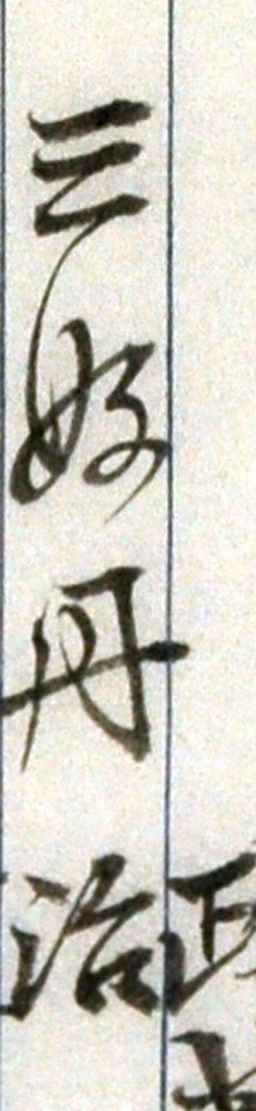三好丹治
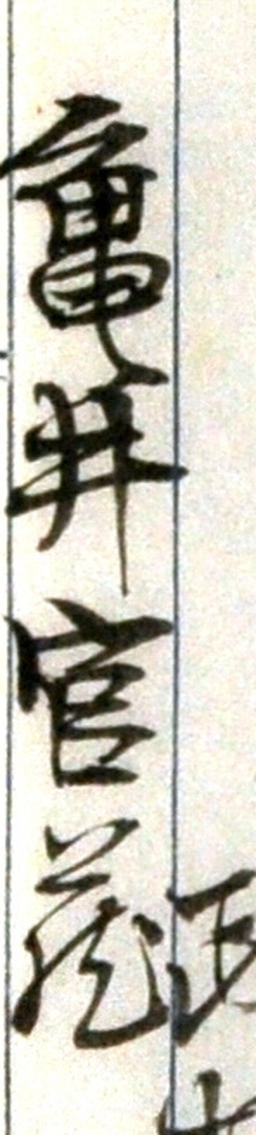亀井宮蔵

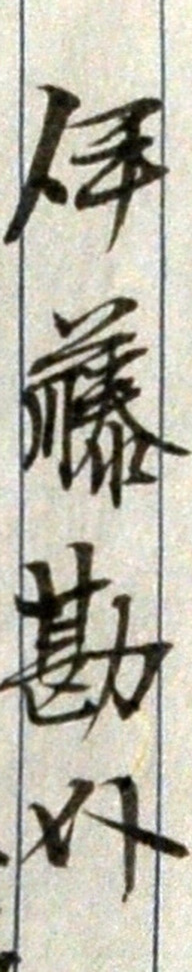伊藤勘介
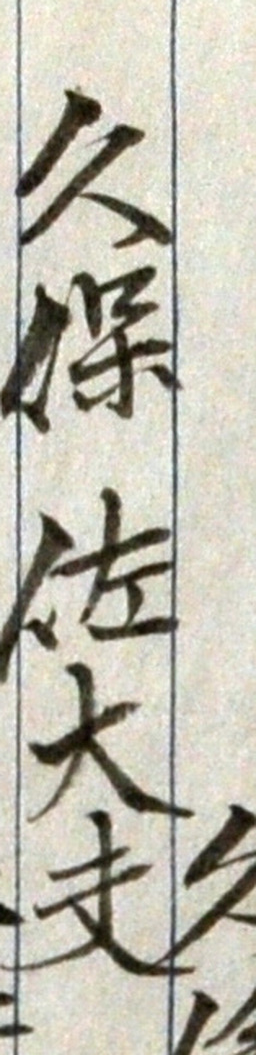久保左大夫
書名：竹内流・甲州流・荒木流・一刀流新当流起請文及免許写堤宝山流手鏡及個之大事
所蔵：伊那市立高遠町図書館・合同会社AMANE
